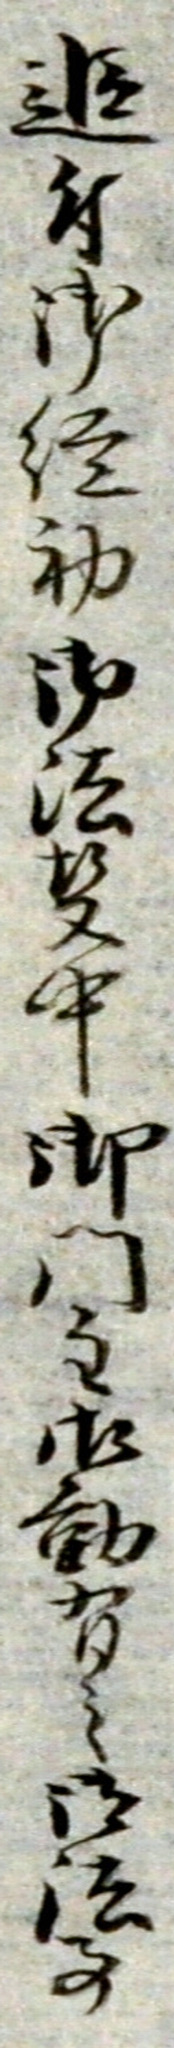追付御経初御法事中御門主御勤有之御法事
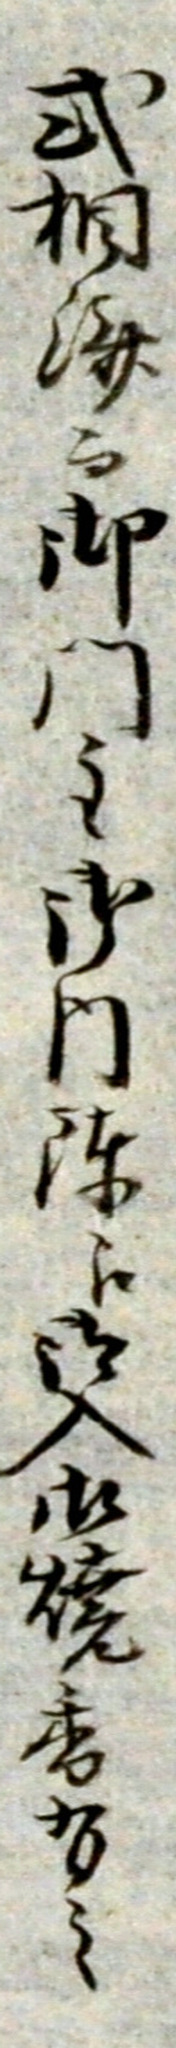式相済而御門とも御門際江御入御焼香有之
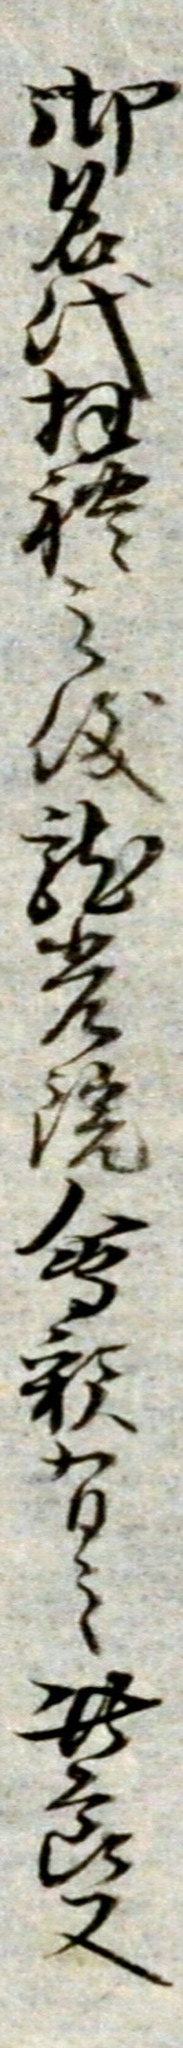御名代拝礼之儀龍光院会釈有之此節又
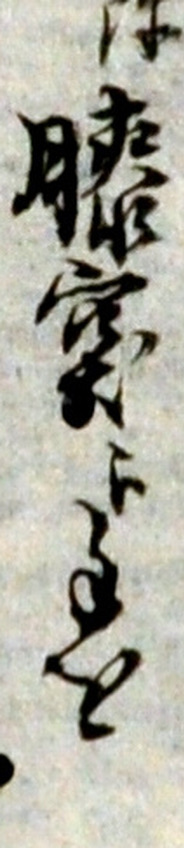膝突江手を
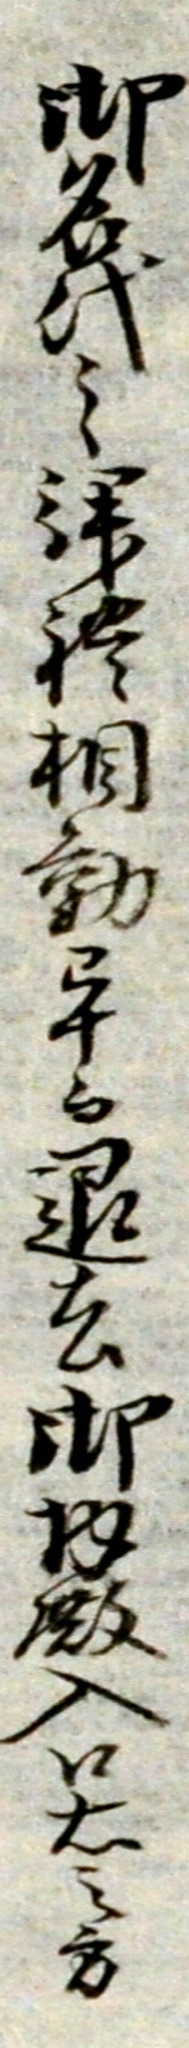御名代之拝礼相勤畢而退去御拝殿入口右之方
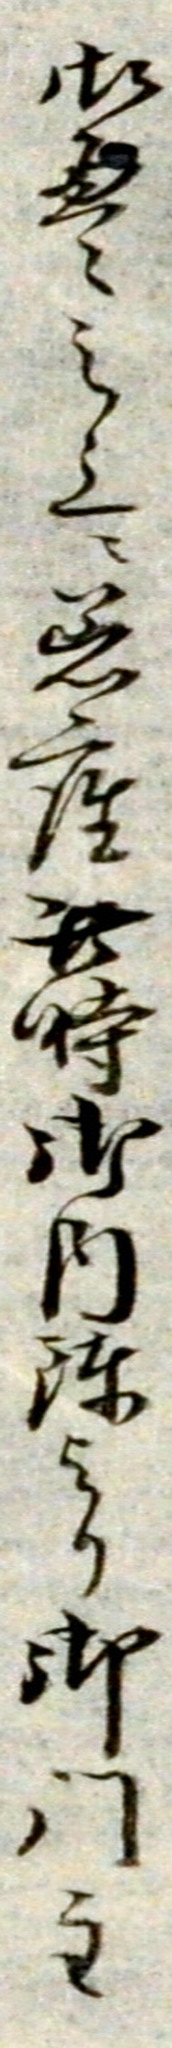御畳之上ニ着座此時御内陣より御門主
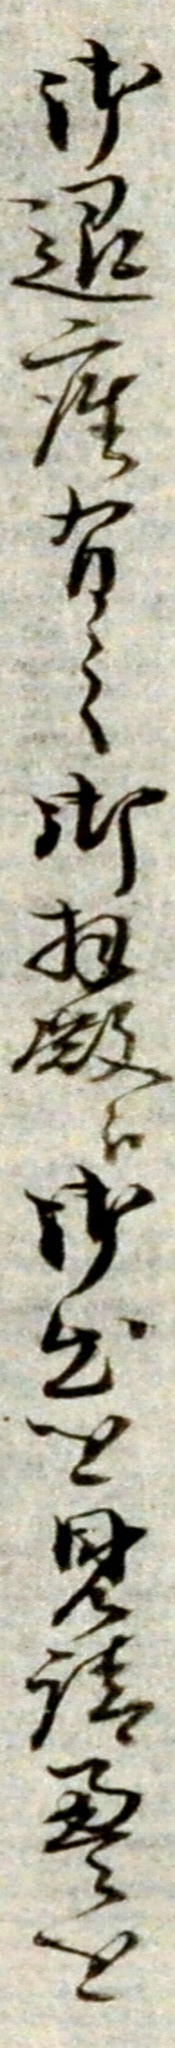御退座有之御拝殿江御出を見請畳を
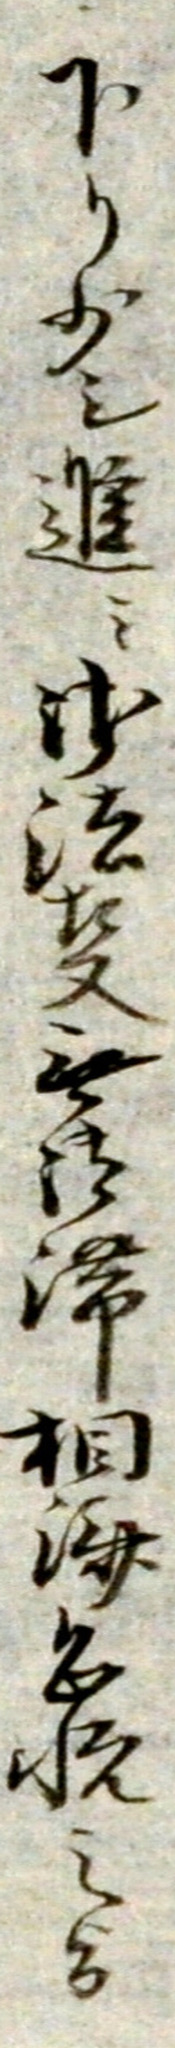下り少シ進ミ御法事無御滞相済恐悦之旨
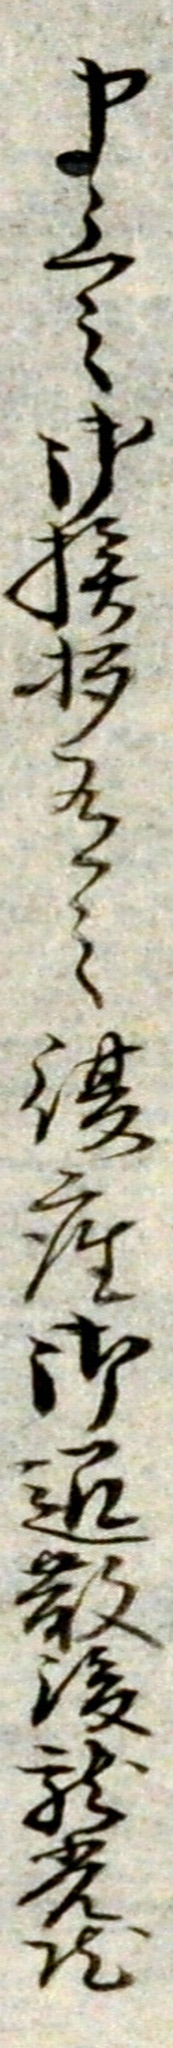申上之御挨拶有之復座御退散後龍光院
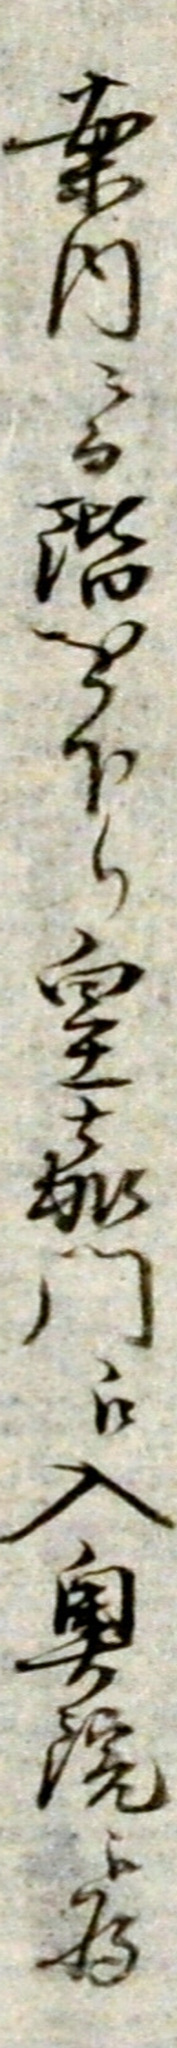案内ニ而階を下り皇嘉門江入奥院江為
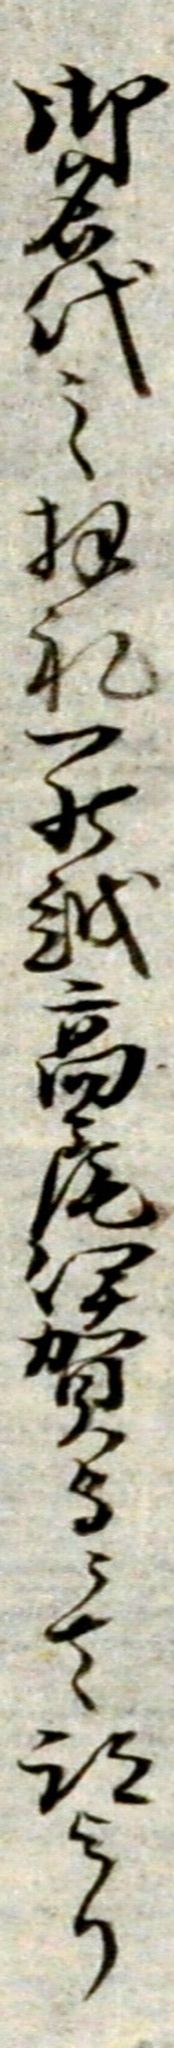御名代之拝礼罷越高尾伊賀守ニ者跡より
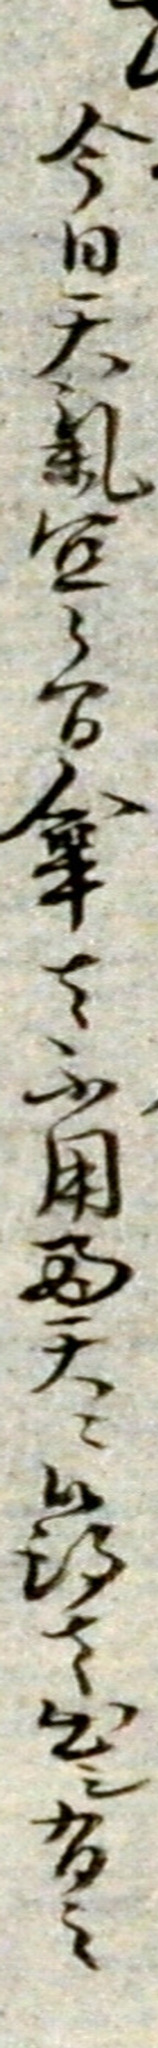今日天気宜之間傘者不用雨天ニ候得者出シ有之
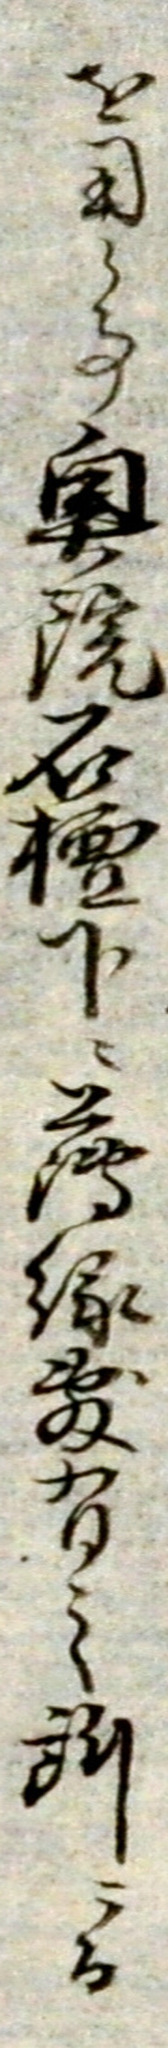を用候事奥院石檀下ニ薄縁敷有之所ニ而
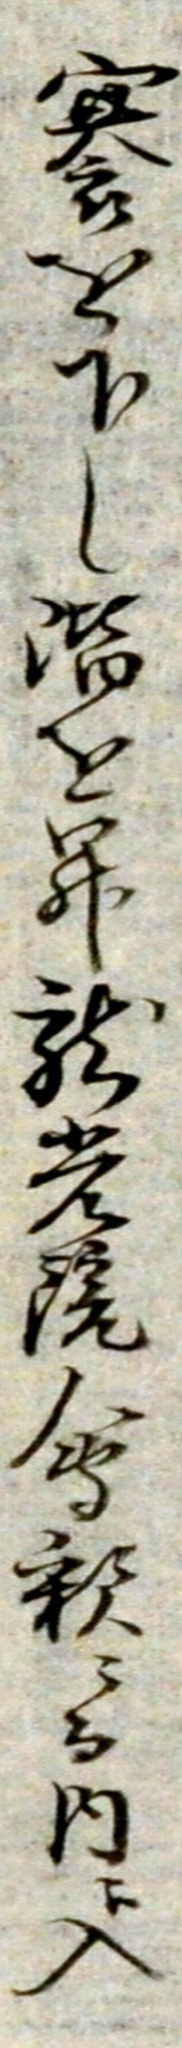褰を下し階を昇龍光院会釈ニ而内江入
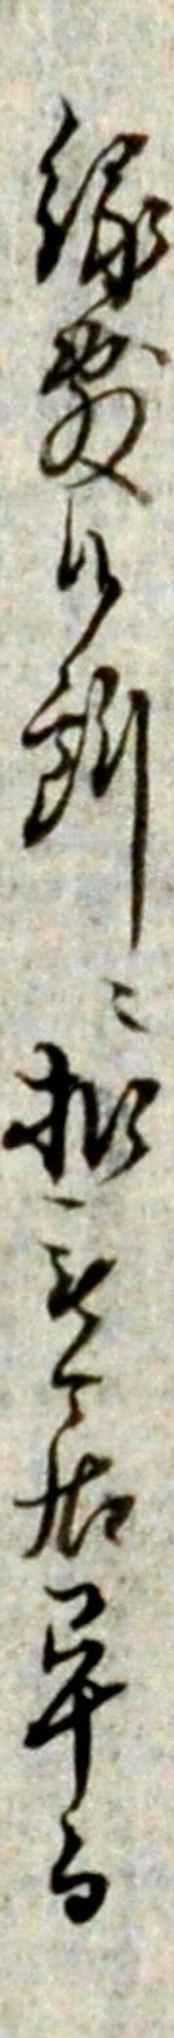薄縁敷候所ニ扣被居畢而
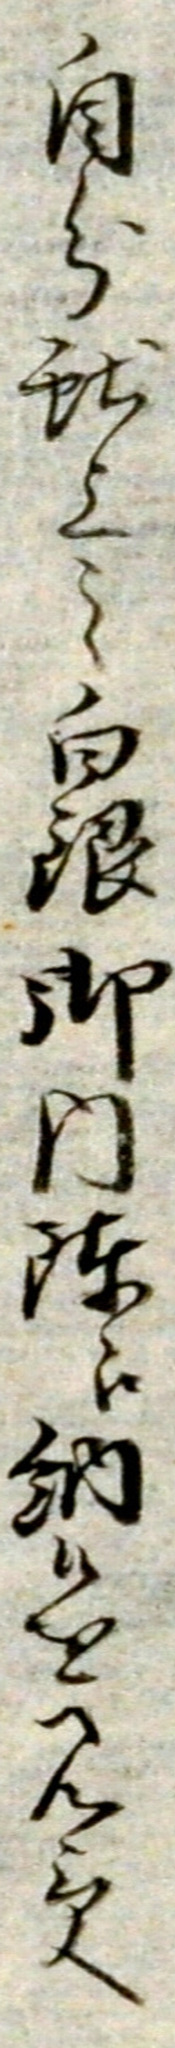自分献上之白銀御内陣江納候を見受
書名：日光御名代相勤候節ノ留
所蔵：伊那市立高遠町図書館・合同会社AMANE
